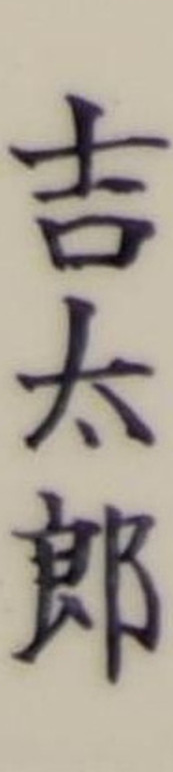吉太郎
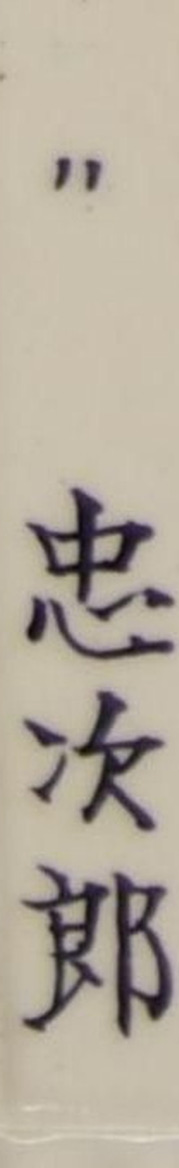忠次郎
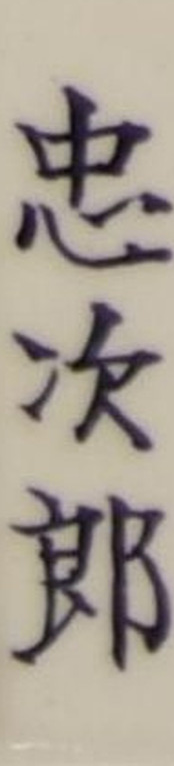忠次郎

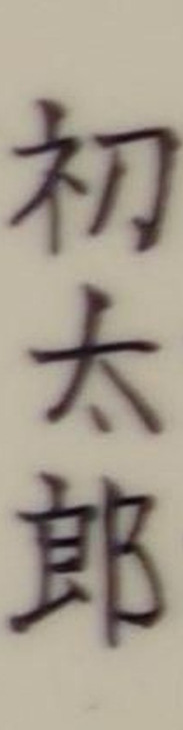初太郎
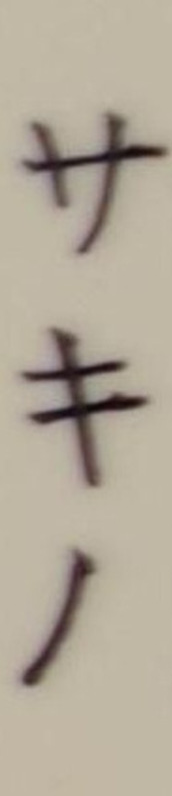サキノ
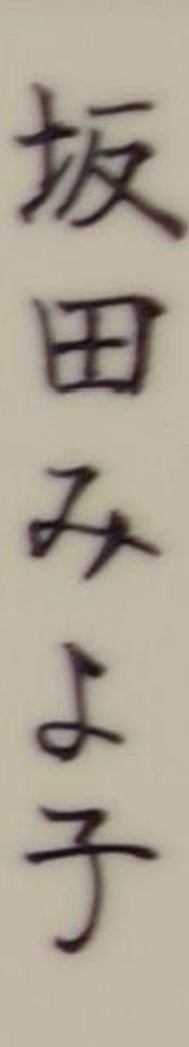坂田みよ子
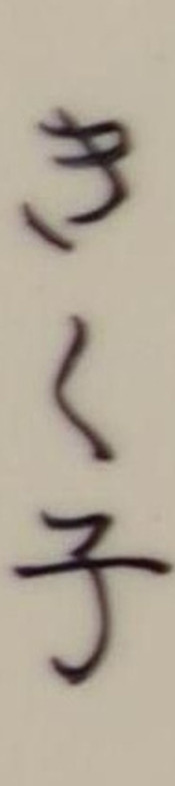きく子
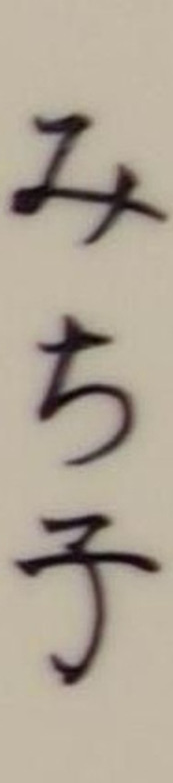みち子
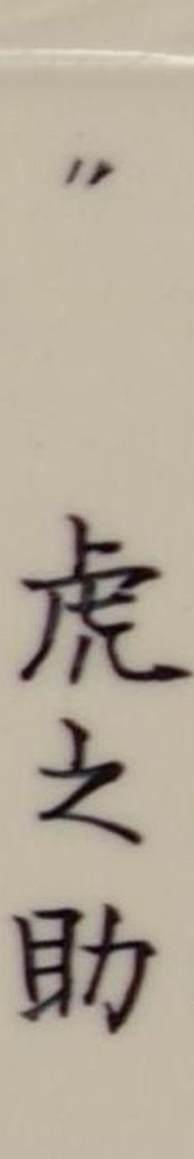虎之助
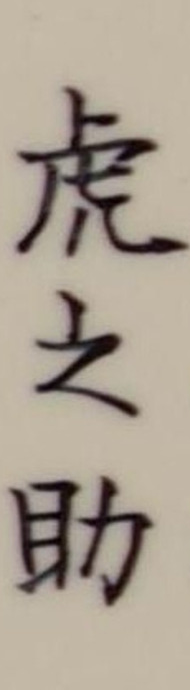虎之助
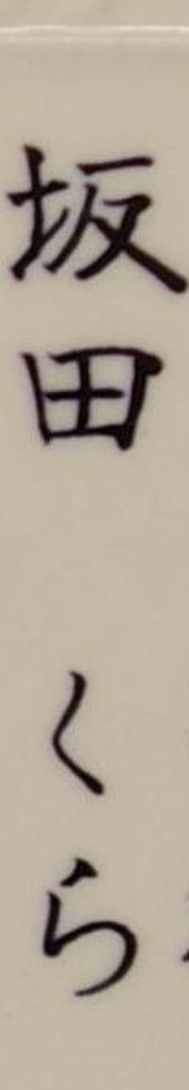坂田くら
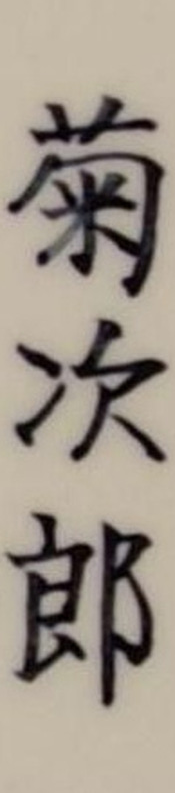菊次郎
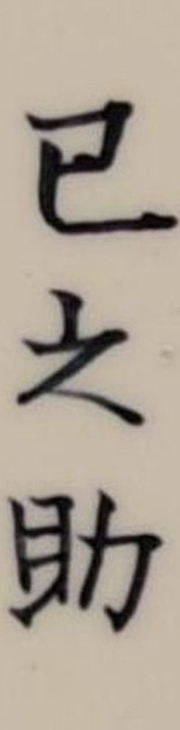巳之助
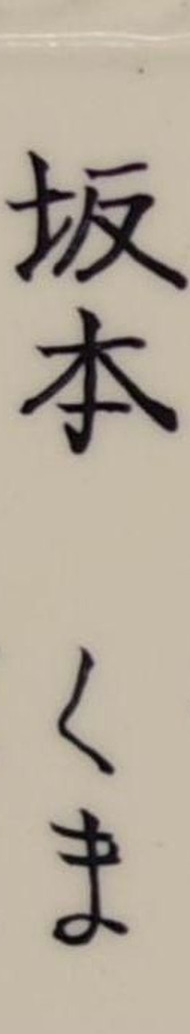坂本くま

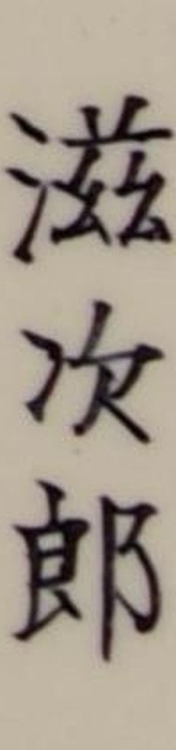滋次郎
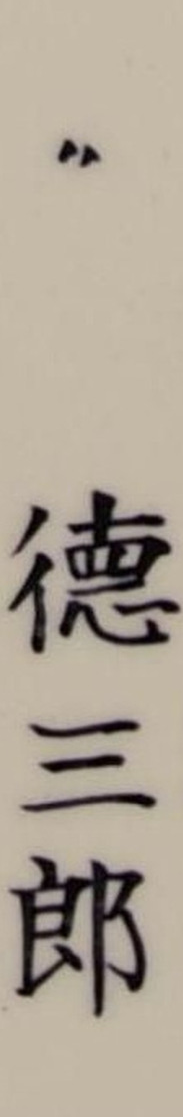徳三郎
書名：E~L
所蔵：高野山金剛峯寺
